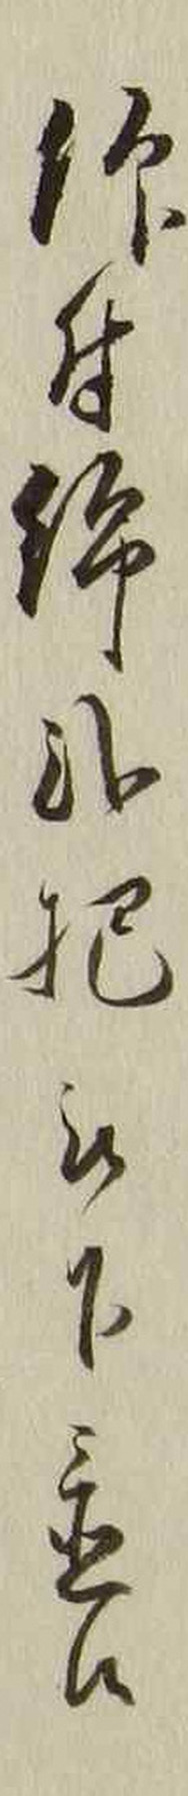仰付綿弐把被下置候
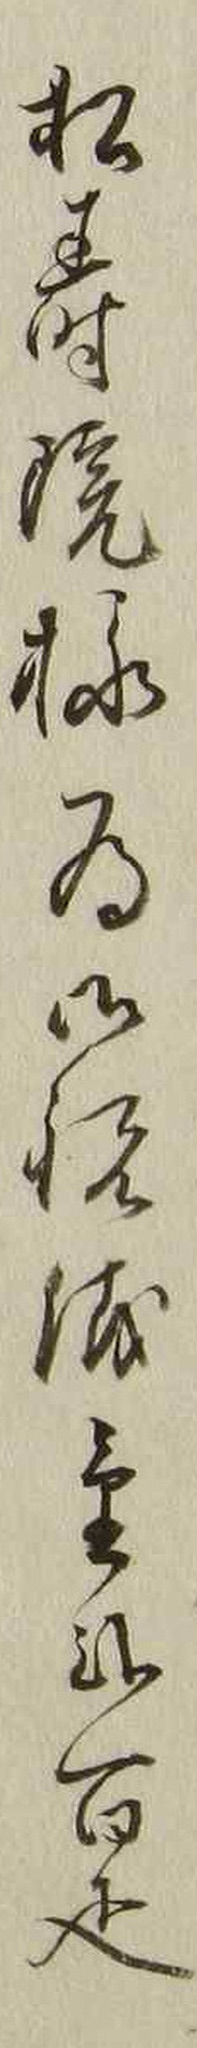松寿院様為御祝儀金弐百疋
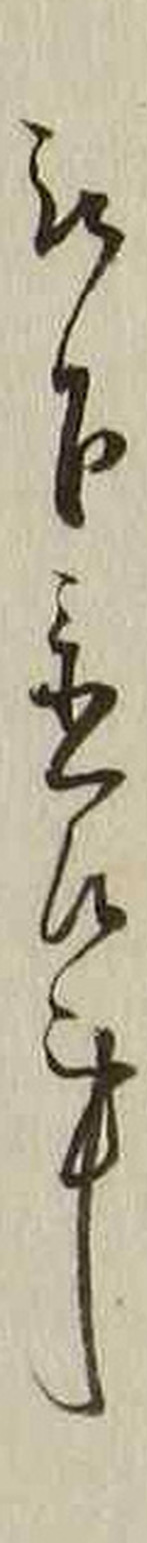被下置候事
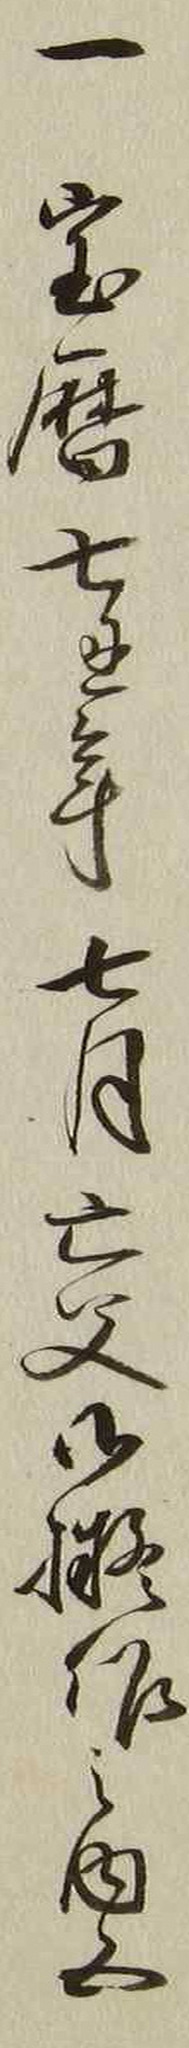一宝暦七丑年七月亡父御擬作之内五
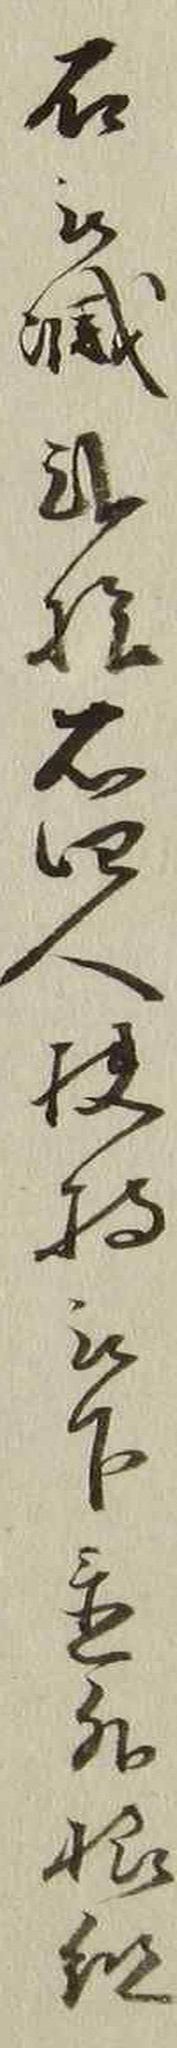石被減弐拾石四人扶持被下置外様組
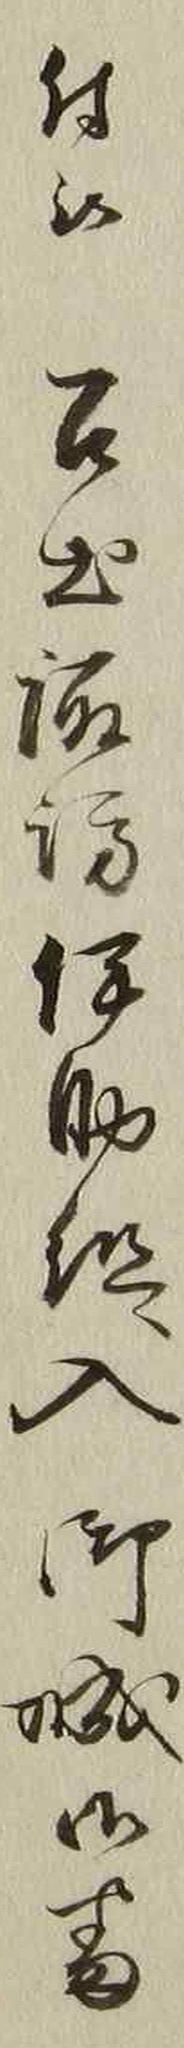付被召出諏訪伊助組へ入御城御番
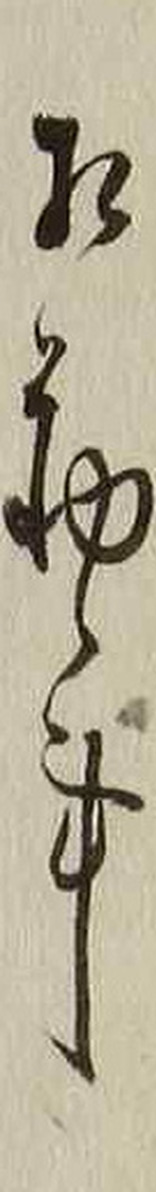相勤候事
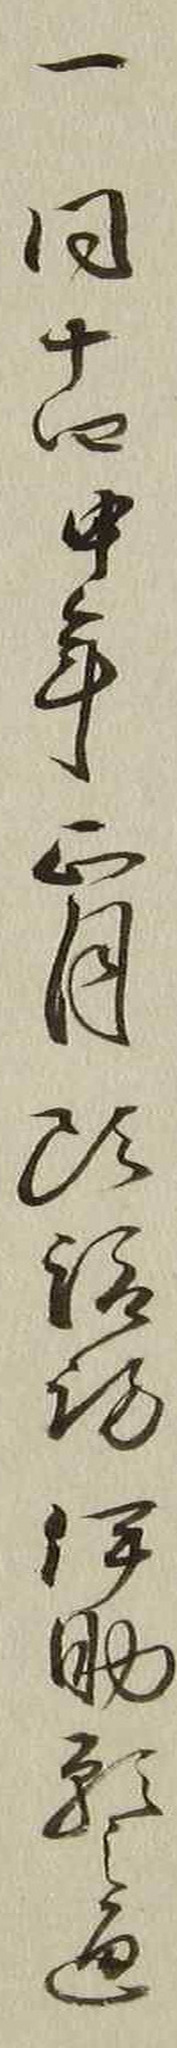一同十四申年正月頭諏訪伊助願之通
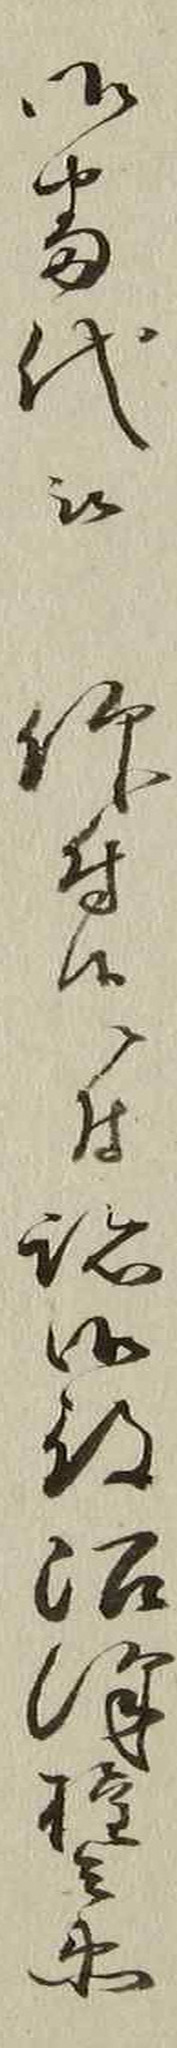御番代被仰付候ニ付跡御役沼沢権兵衛
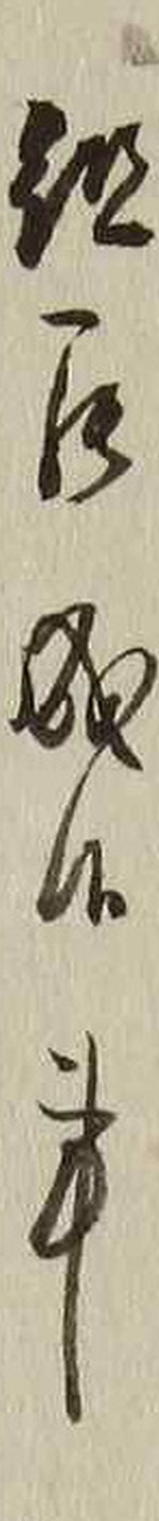組罷成候事
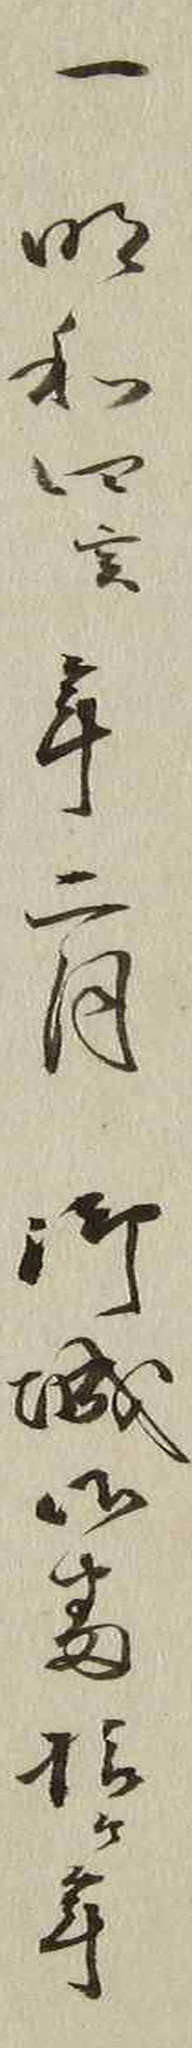一明和四亥年二月御城御番拾ケ年
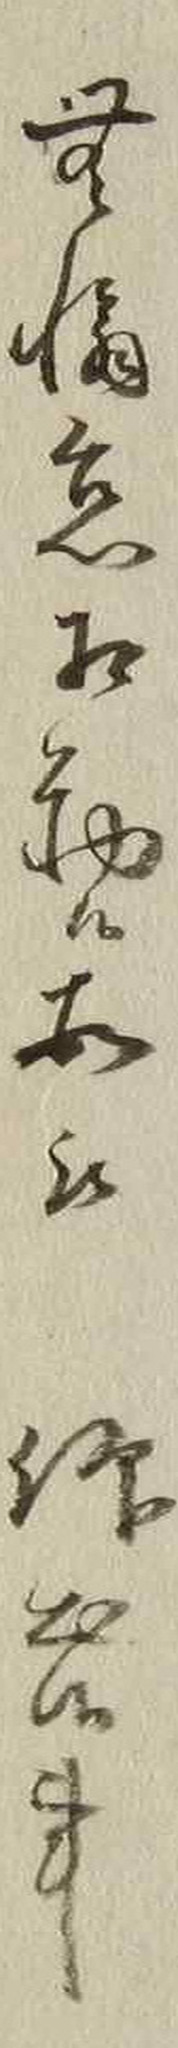無懈怠相勤候段被仰出候事
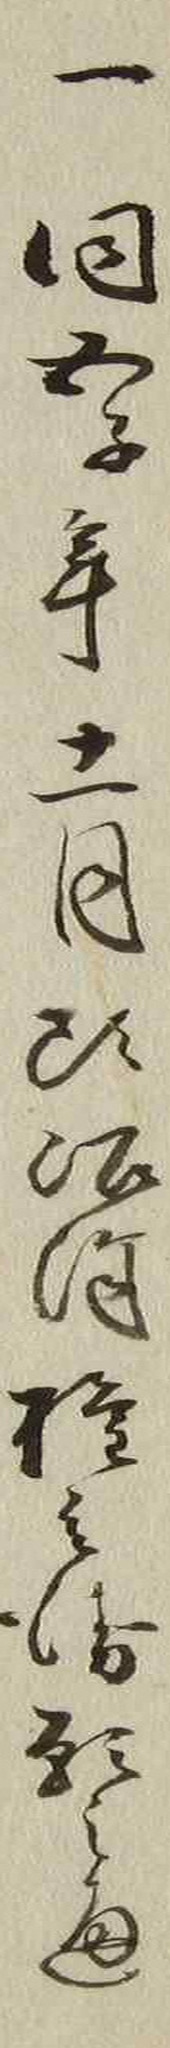一同五子年十一月頭沼沢権兵衛願之通
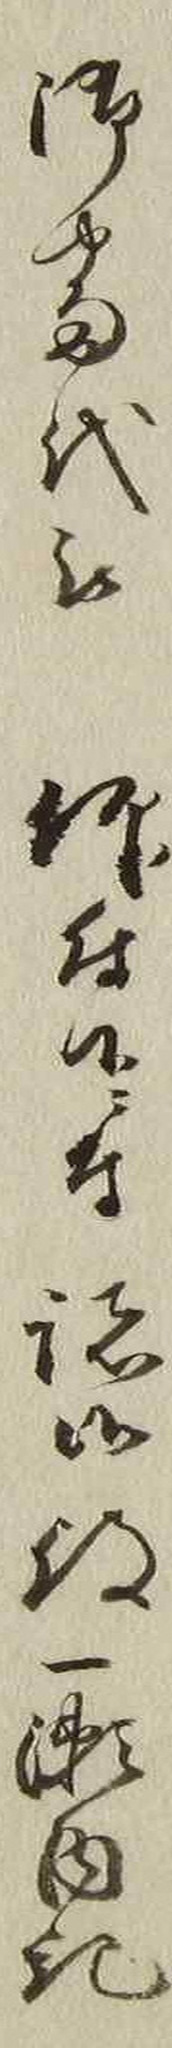御番代被仰付候ニ付跡御役一瀬内記
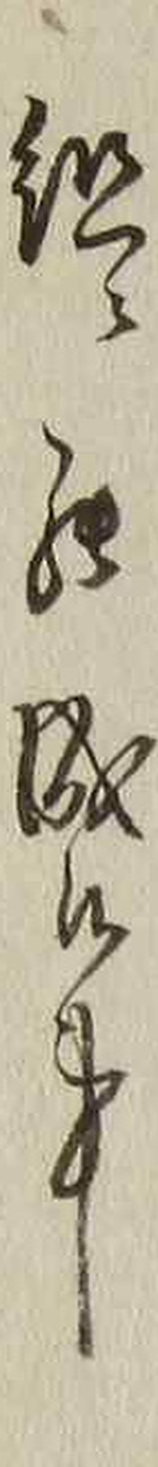組罷成候事
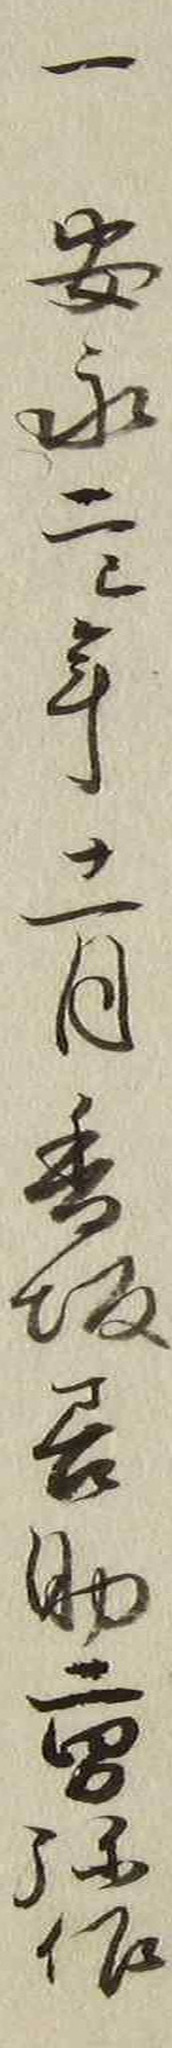一安永二巳年十一月香坂善助二男弥作
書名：諸士系譜　巻之28　い之部28
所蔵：会津若松市立会津図書館
